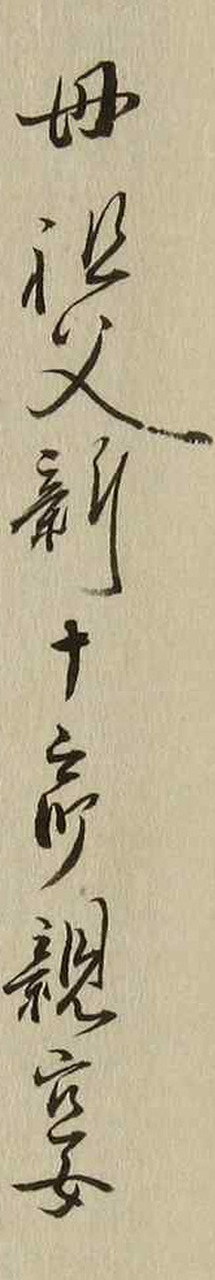母祖父新十郎親宜女
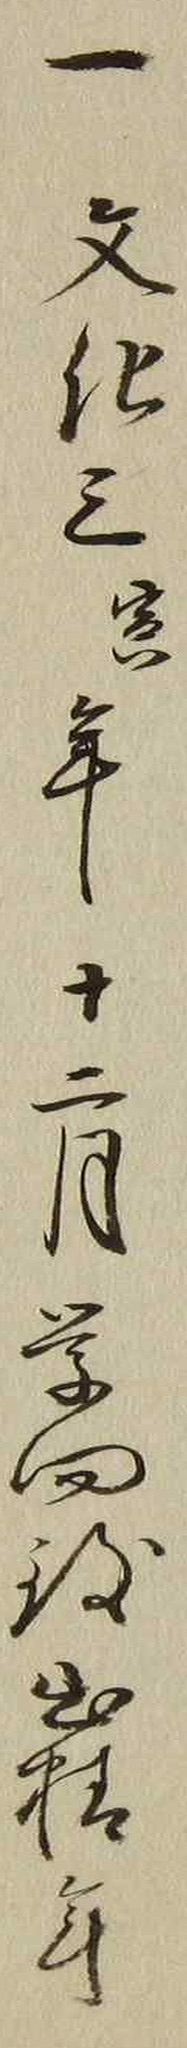一文化三寅年十二月学問致出精年
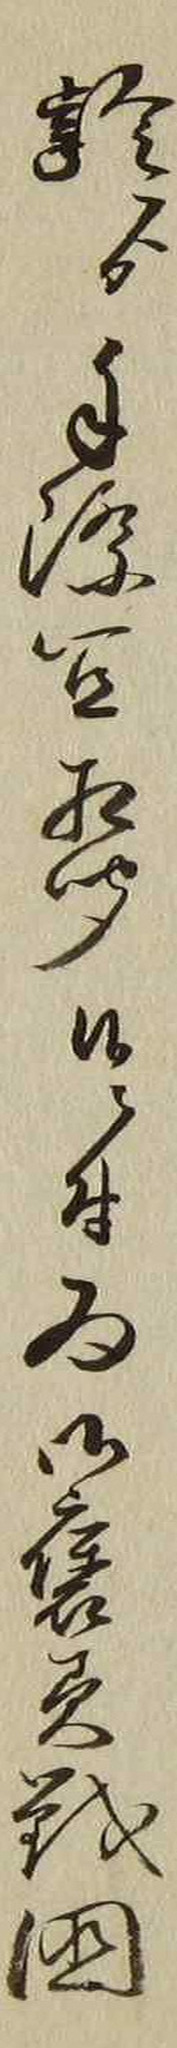齢ゟ手際宜相聞候ニ付為御褒美戦国
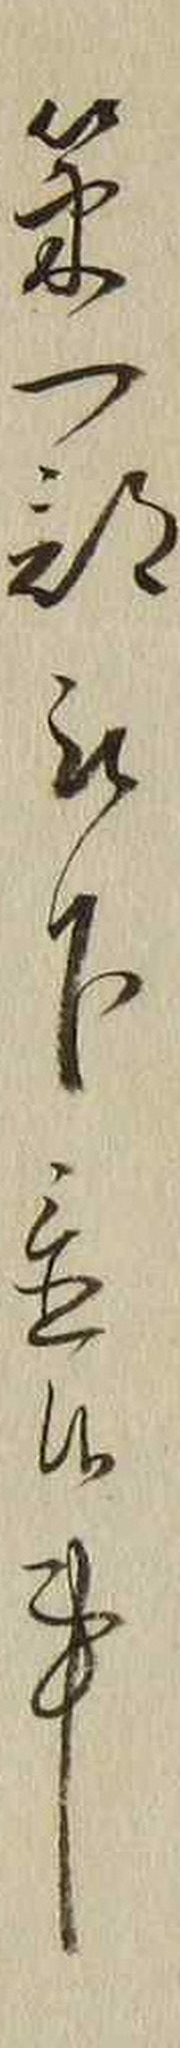策一部被下置候事
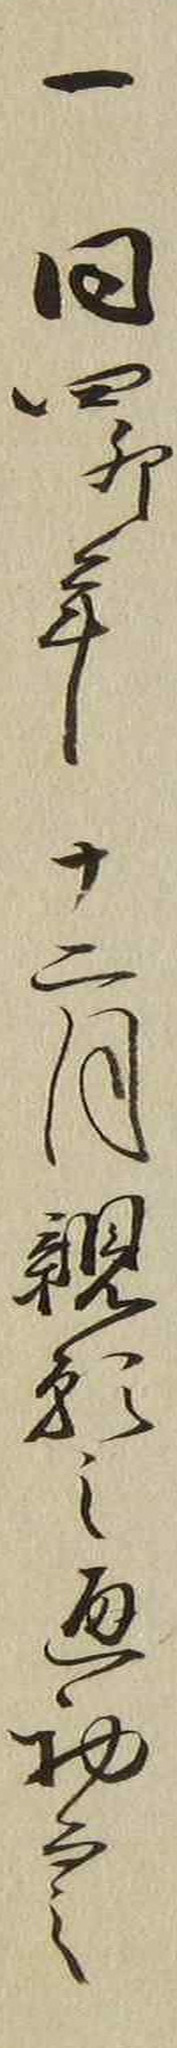一同四卯年十二月親願之通初而之
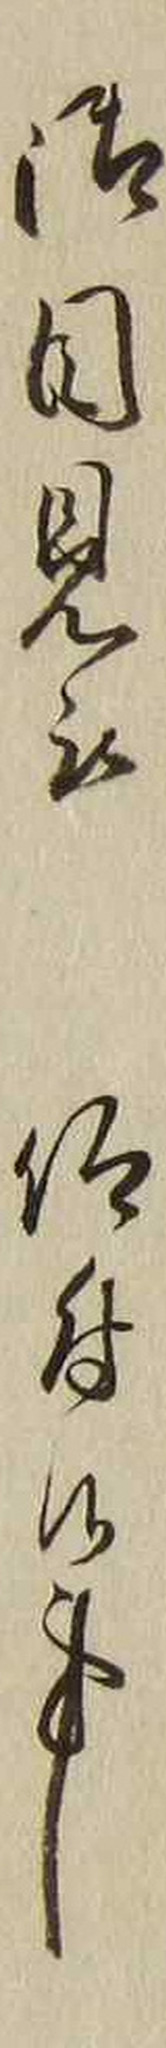御目見被仰付候事

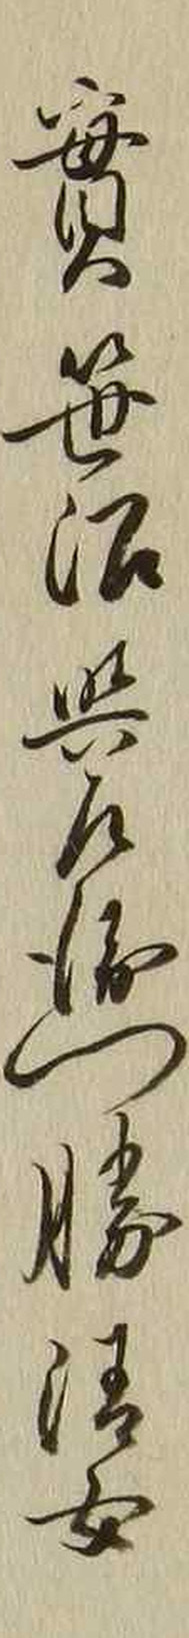実笹沼与左衛門勝清女
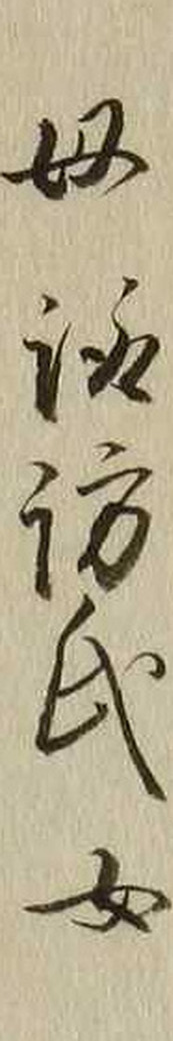母諏訪氏女
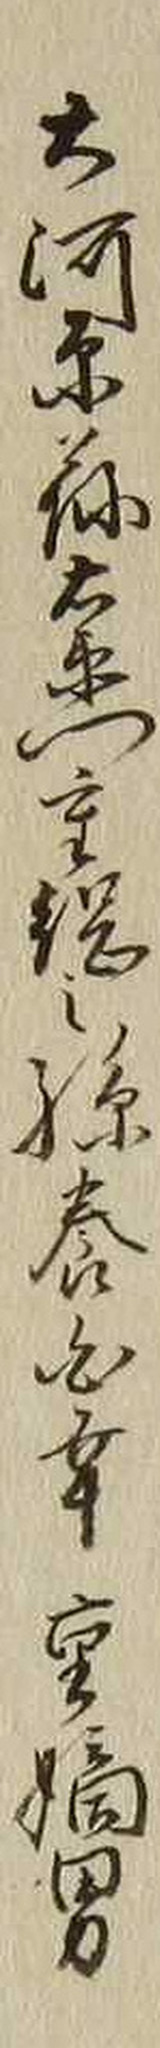大河原藤右衛門重綱之孫養白幸重嫡男
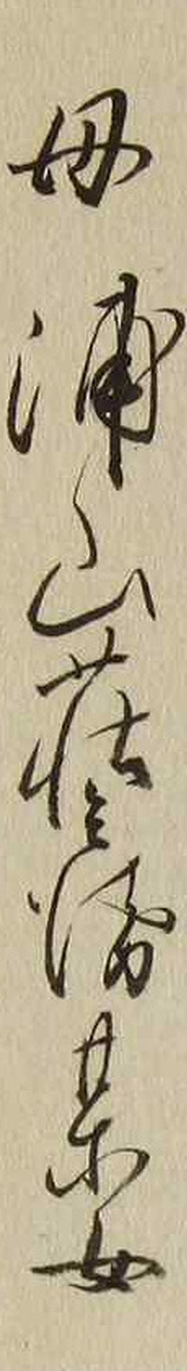母浦山荘兵衛某女
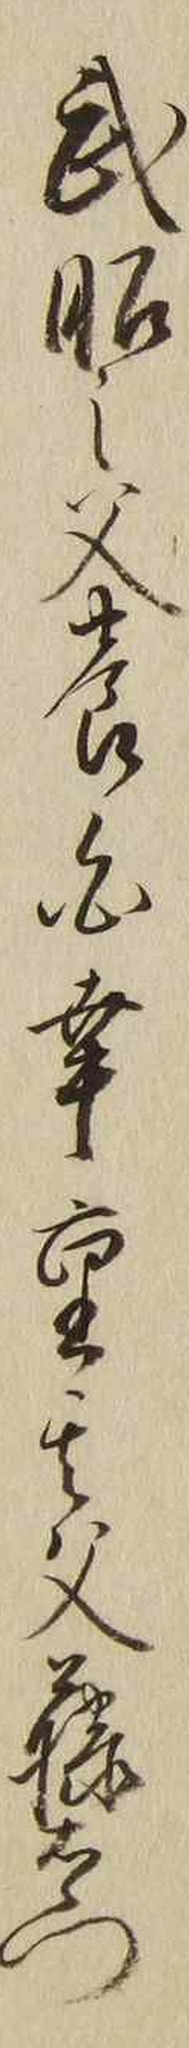武昭之父養白幸重其父藤右衛門
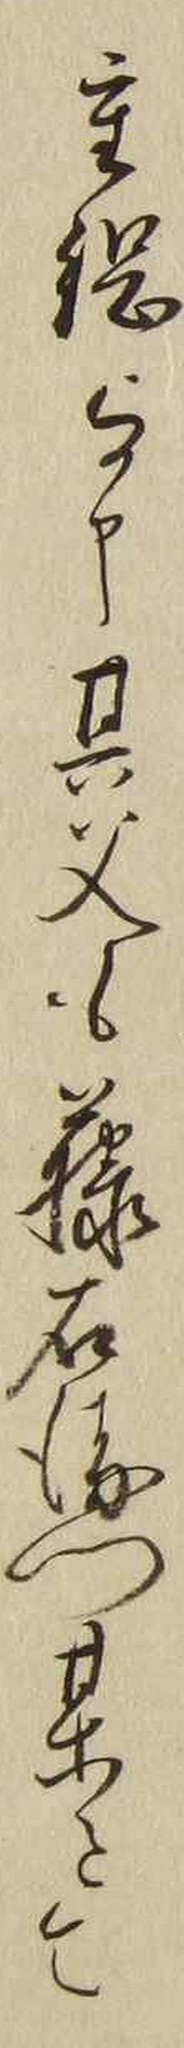重綱与申其父も藤右衛門某とて

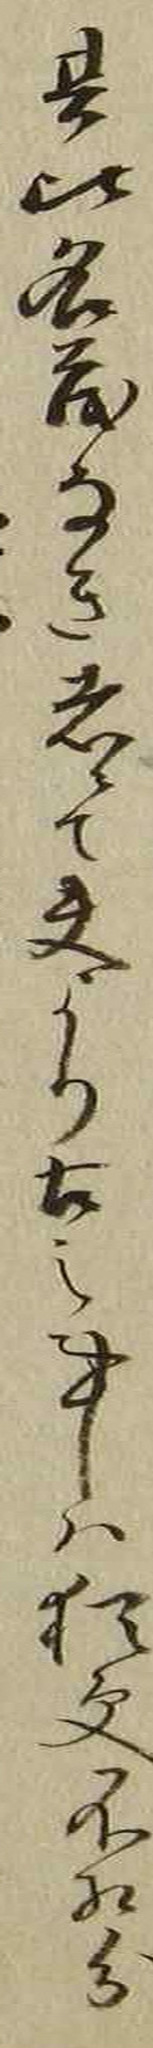其比名もなき者ニて夫より古之事ハ猶更不相分
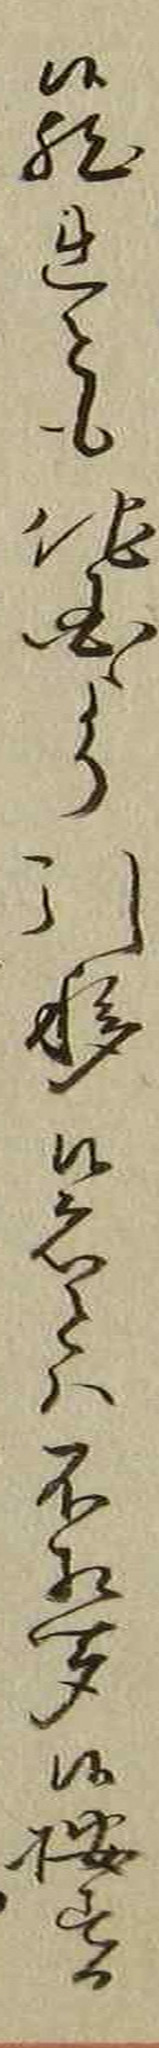候然れとも他国より引移候者とハ不相聞候按する
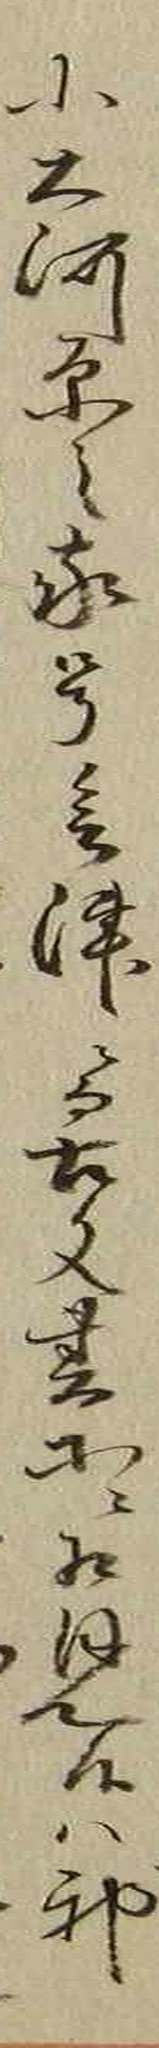に大河原之家号会津ニ而古文書等ニ相見候ハ耶
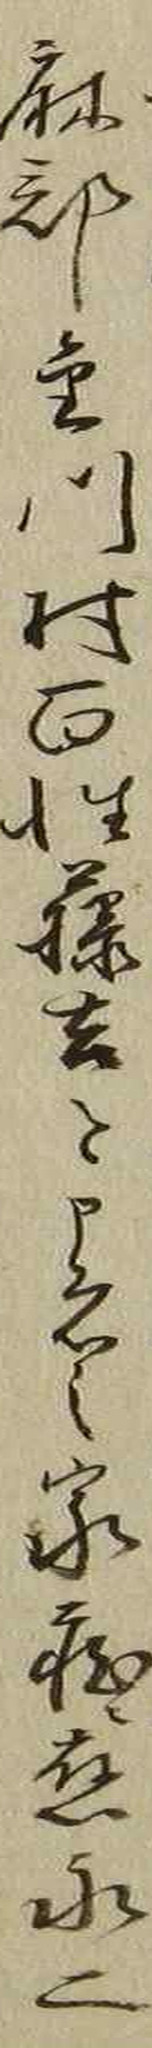麻郡金川村百姓藤吉と申者之家蔵ニ応永二
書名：諸士系譜　巻之68　を之部2
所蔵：会津若松市立会津図書館
